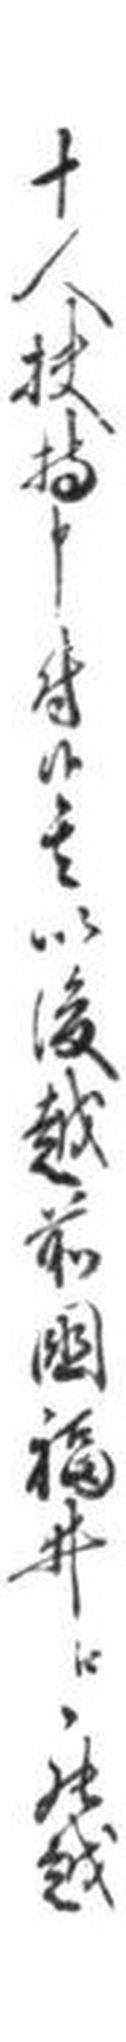十人扶持申付候其以後越前国福井江罷越
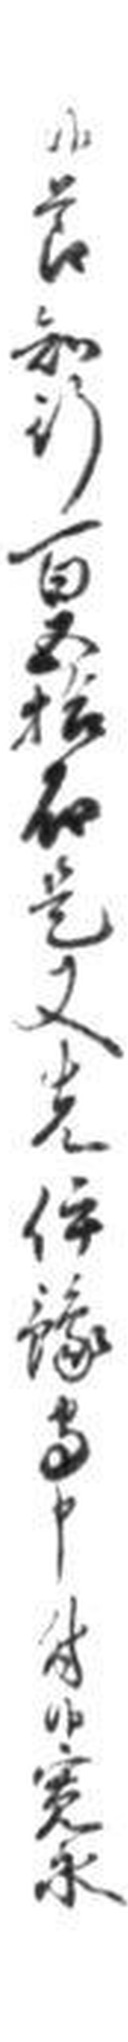候節知行百五拾石是又先伊予守申付候寛永
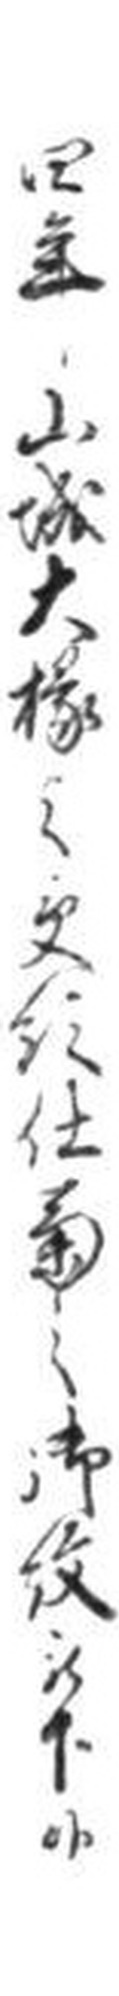四年山城大掾与受領仕菊之御紋被下候
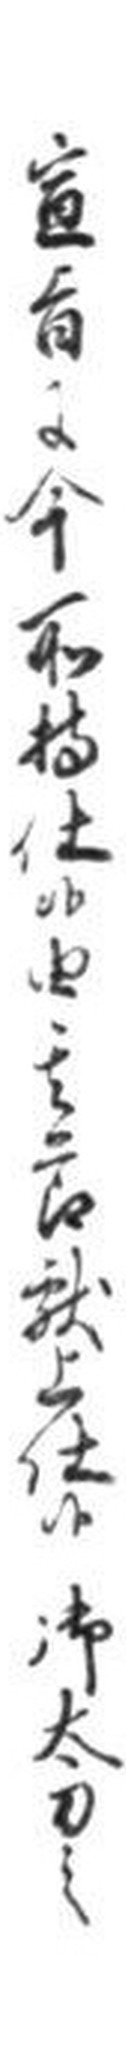宣旨に令所持仕候由其節献上仕候御太刀之
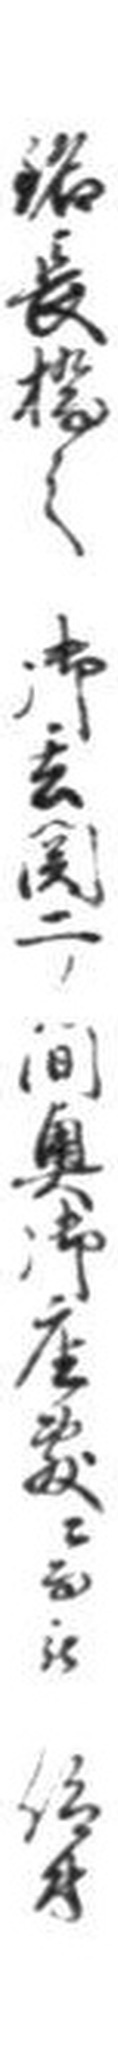銘長橋之御玄関二ノ間奥御座敷ニ而被仰付
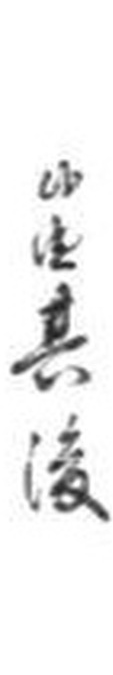候由其後
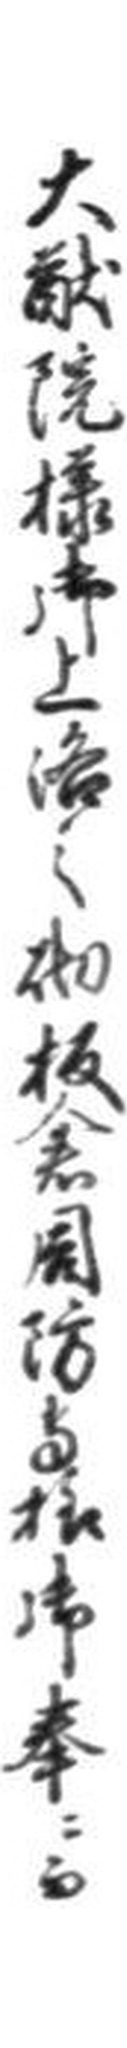大猷院様御上洛之砌板倉周防守様御奉ニ而
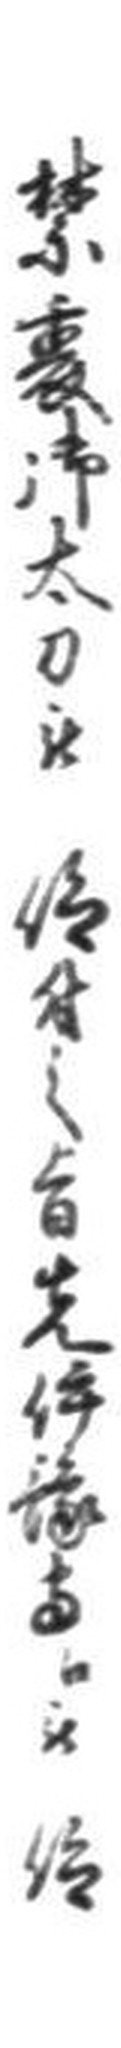禁裏御太刀被仰付之旨先伊予守江被仰
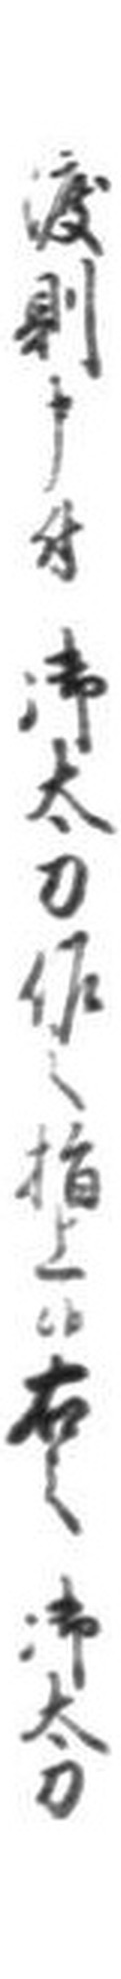渡則申付御太刀作之指上候右之御太刀
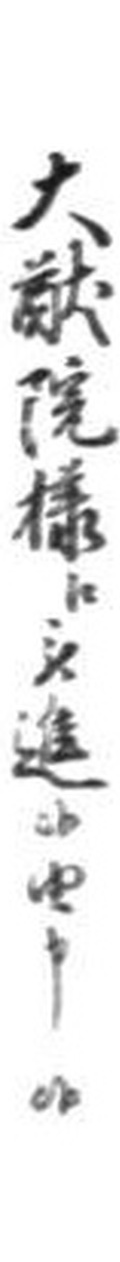大猷院様江被進候由申候
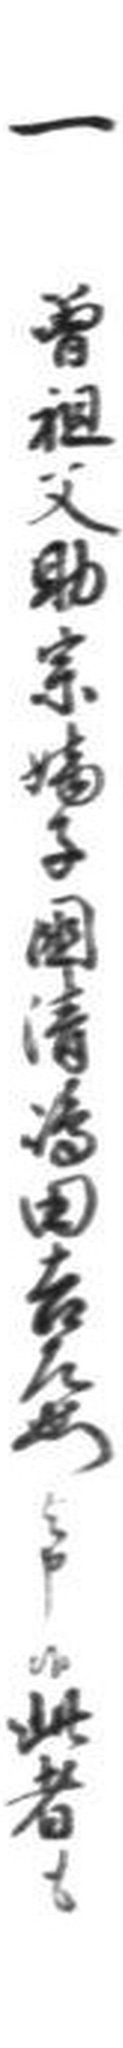一曾祖父助宗嫡子国清嶋田吉左衛門与申候此者も
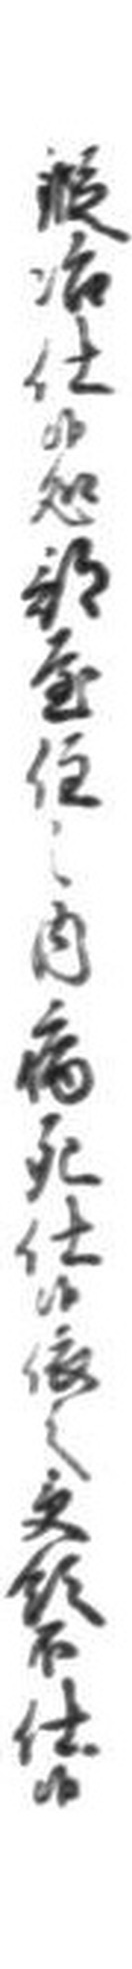鍛冶仕候処部屋住之内病死仕候依之受領不仕候
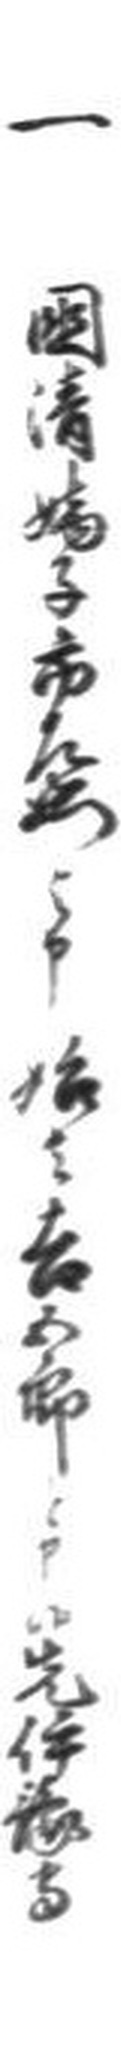一国清嫡子市左衛門与申始者吉五郎と申候先伊予守
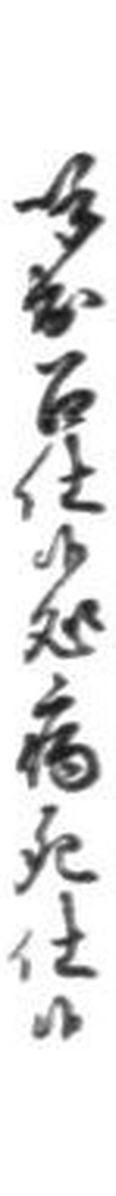呼出召仕候処病死仕候

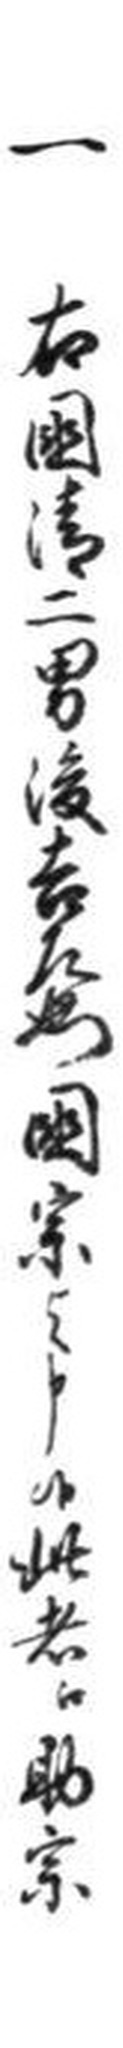一右国清二男後吉左衛門国宗与申候此者江助宗
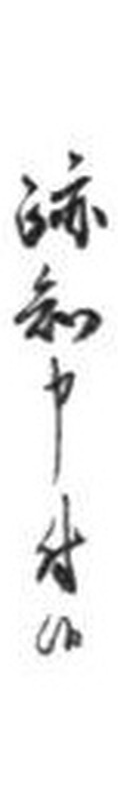跡知申付候
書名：家譜 三十三 吉邦公 享保四年
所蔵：福井県文書館 Fukui Prefectural Archives
